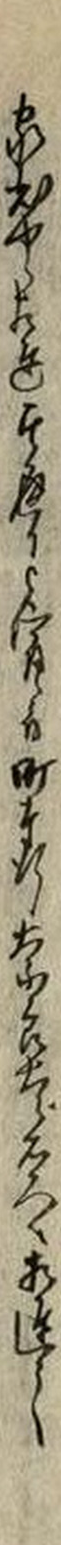家老中へ相達其通り被仰付候に付町奉行奈良太郎右衛門へ相達之
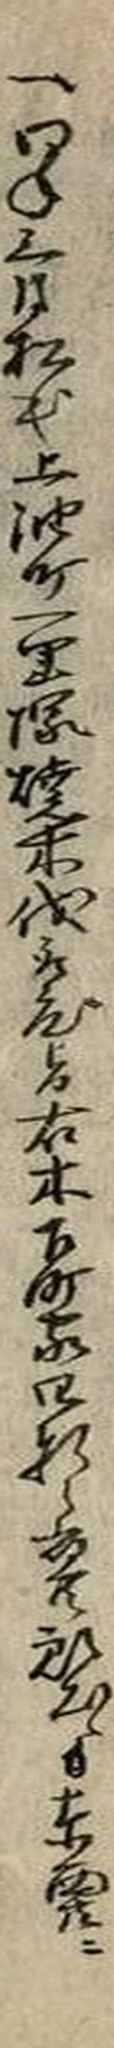一同年三月松本上油町一里塚焼木伐取度旨右木下町家四軒之者共願出候付東西共に
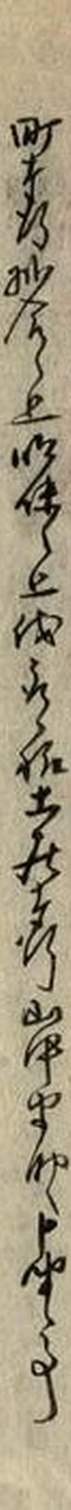町奉行掛合之上吟味之上伐取候様土居奉行山中半助へ申聞候事
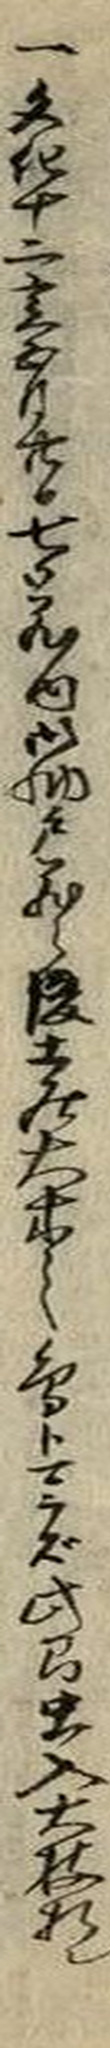一文化十二亥五月廿日七つ蔵内御納戸蔵之後土居大木之鳥トマラズ此間虫入大枝折レ
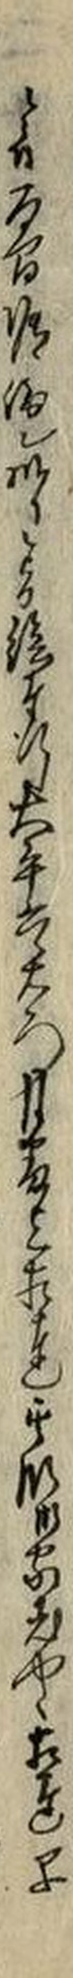候に付百間堀へ倒レ掛り候旨絵奉行大平六郎右衛門月番迄相達其段御家老中へ相達早
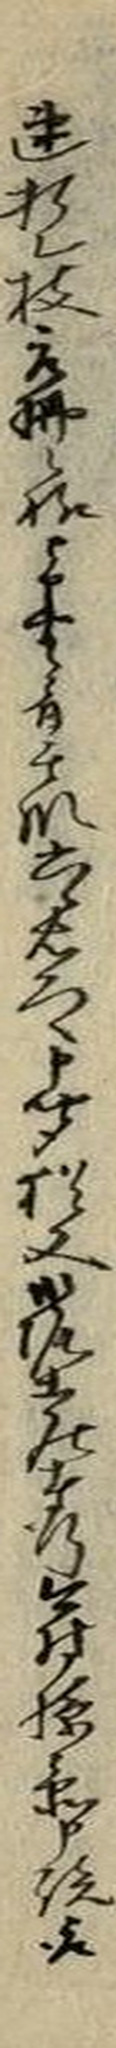速折レ枝取払候様申来候に付其段六郎右衛門へ申聞猶又御堀土居奉行今村孫兵衛申談取
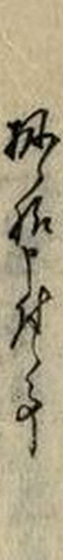扱候様申付候事
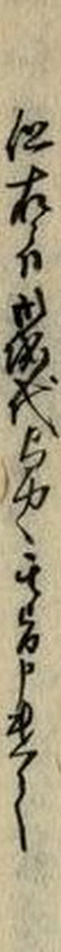但右に付御城代与力へ其旨申遣之
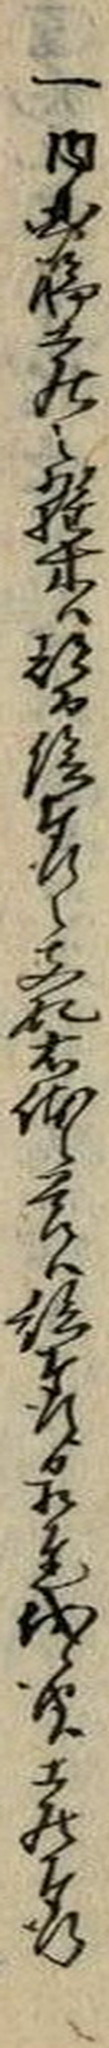一内曲輪土居之雑木は都て絵奉行之支配右体之節は絵奉行ゟ相達伐候儀は土居奉行
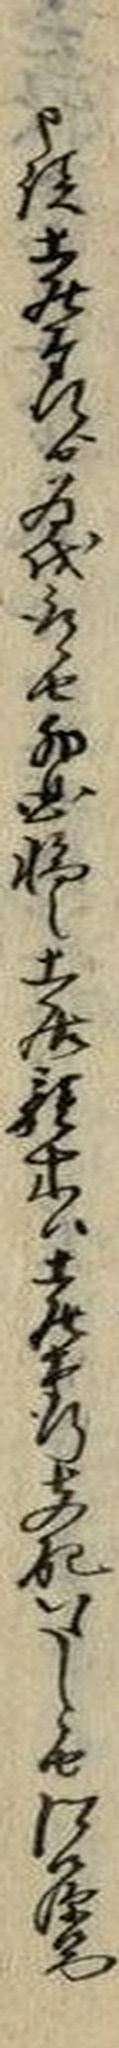申談土居奉行ゟ為伐取候由外曲輪之土居雑木は土居奉行支配いたし候由江口源左衛門
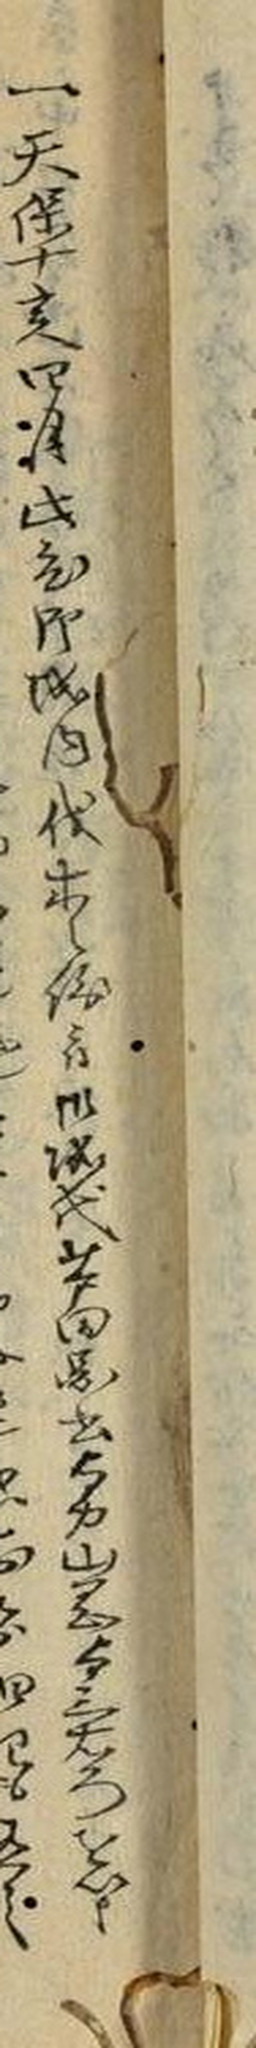一天保十亥四月此度御城内伐木之儀に付御城代芦田図書与力山岡与三右衛門を以申
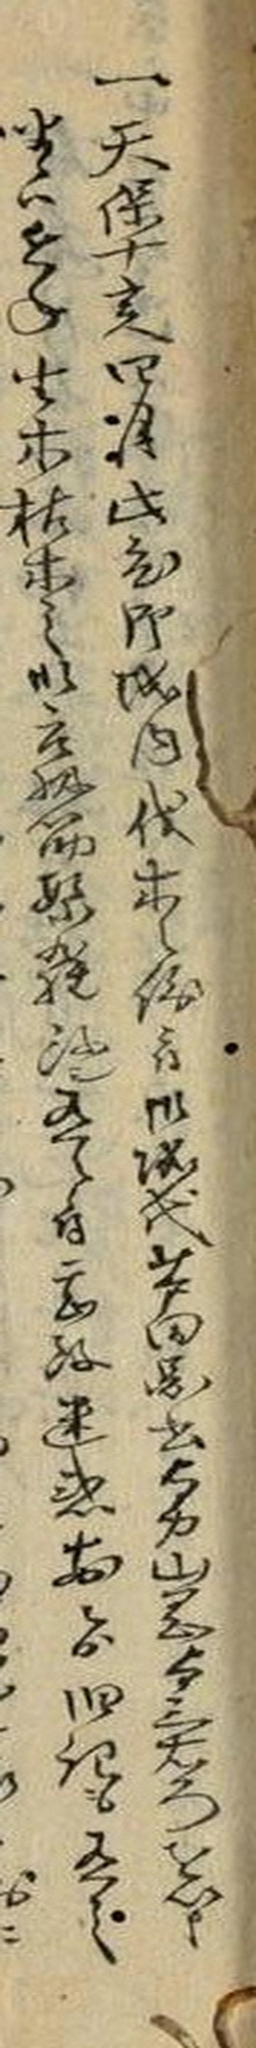聞候は近年生木枯木之御取扱筋繁雑致シ有之に付甚致迷惑前々ゟ旧記も有之
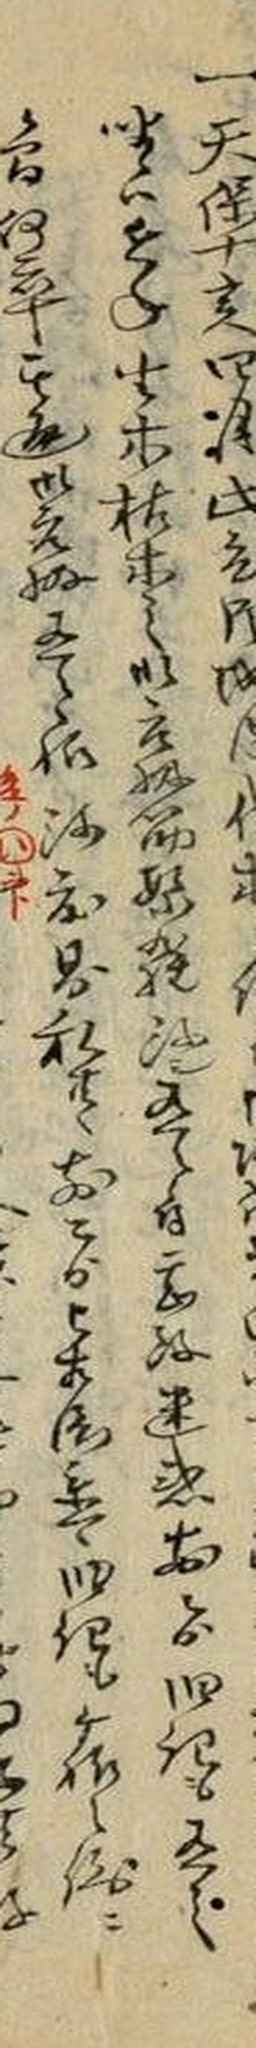候間何卒其通御取扱有之候様致度則私共へ前々ゟ被相渡置候旧記もケ様之儀に
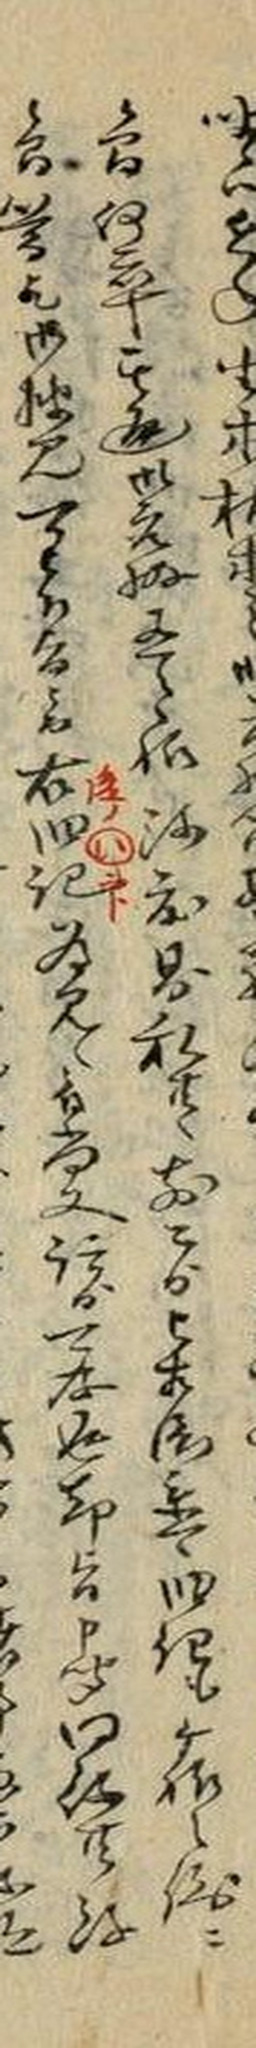候間篤与御披見可被下旨とて右旧記為見候に付尚又跡ゟ可及返却旨申聞同役共致
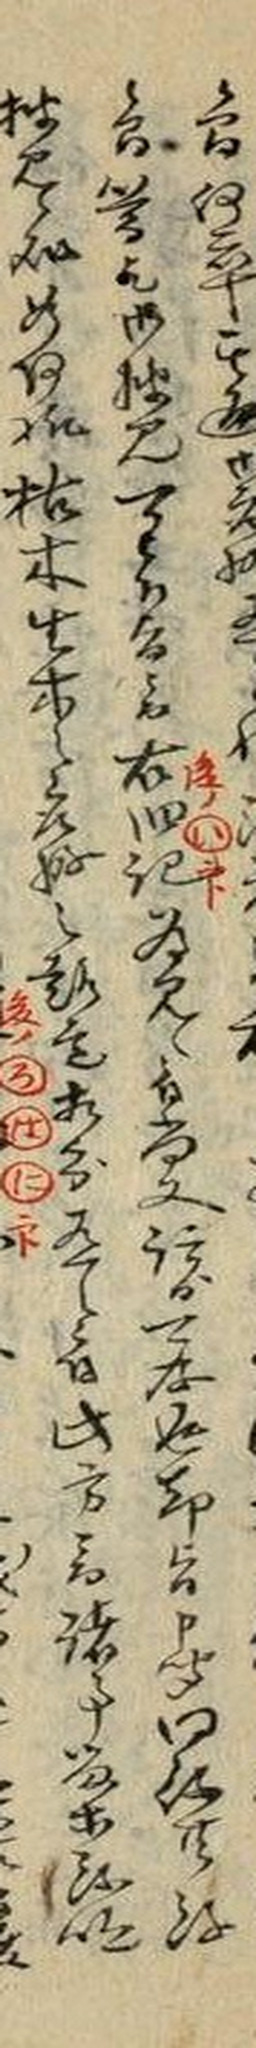披見候処如何様枯木生木之取扱之趣意相分有之に付此方にて諸事留等致吟
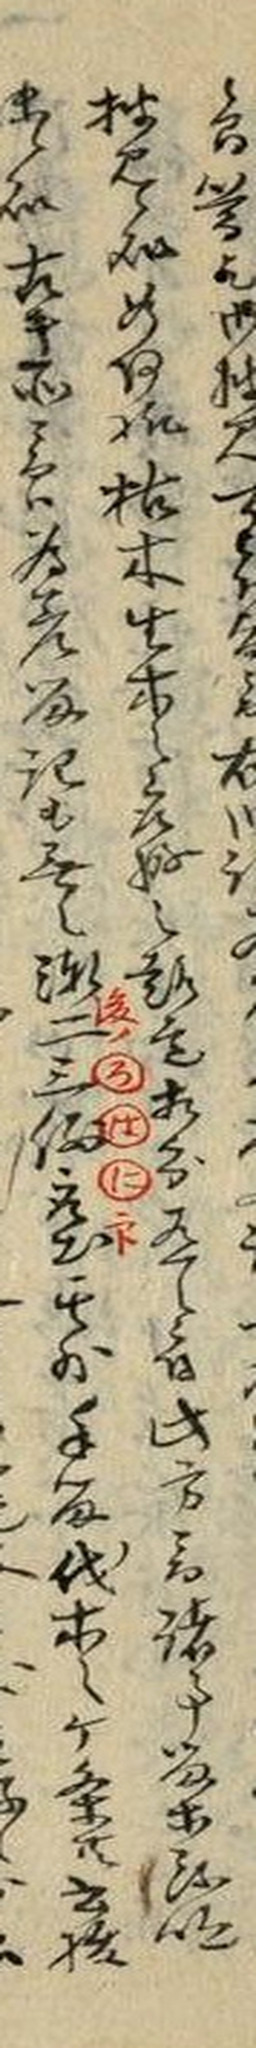味候処古キ品にては為差留記も無之漸二三例取出其外手留伐木之ケ条共書抜
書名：御城下諸事之部
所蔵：福井県文書館 Fukui Prefectural Archives
